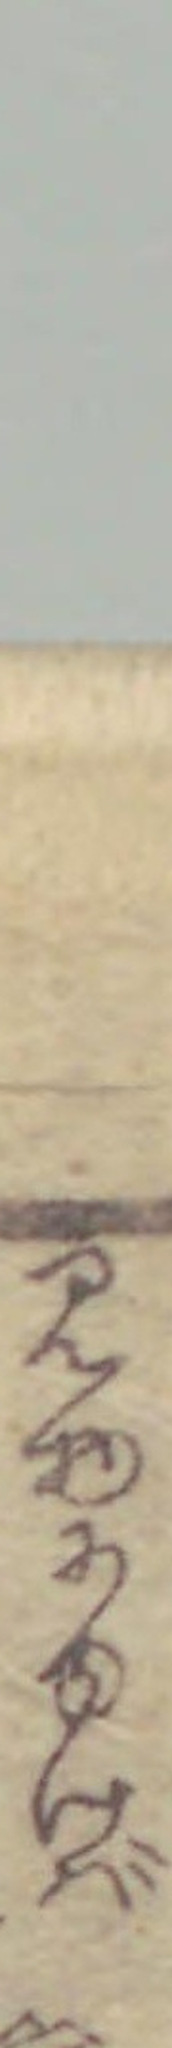見物にゆけば
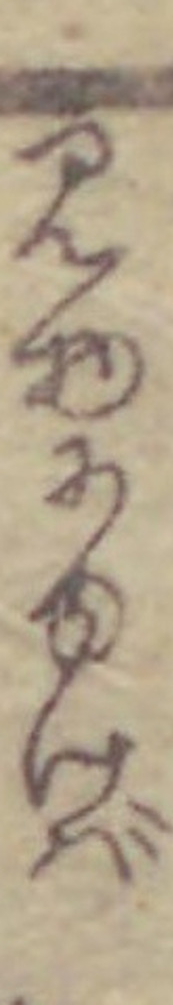見物にゆけば
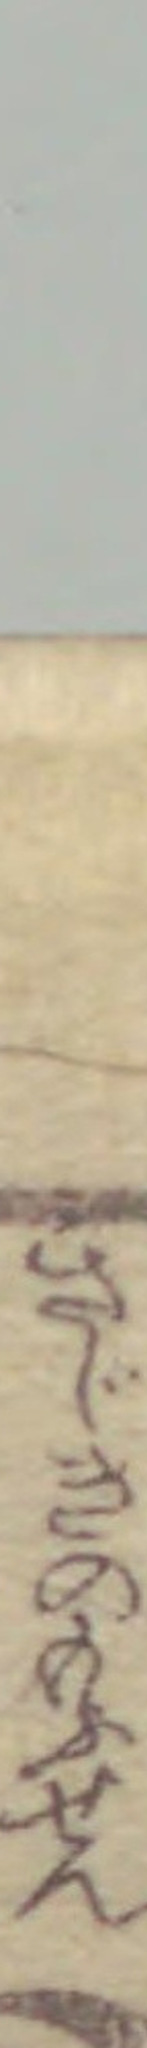さじきのもふせん
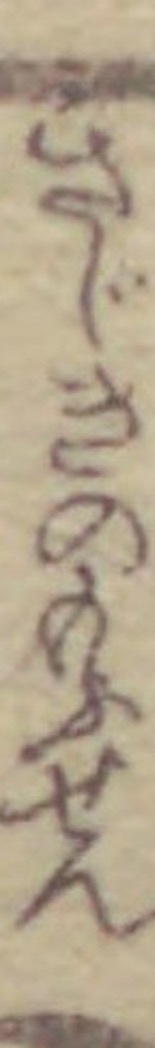さじきのもふせん
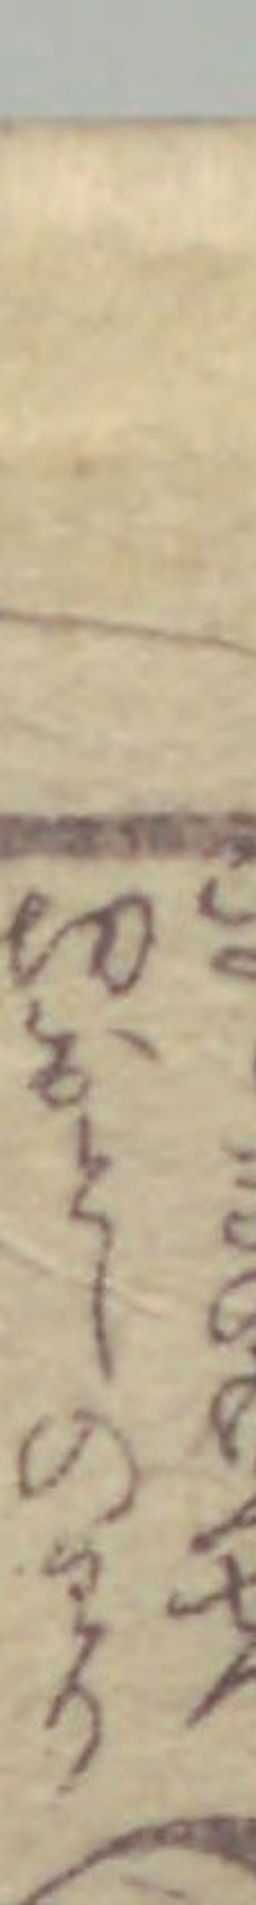切おとしのわり
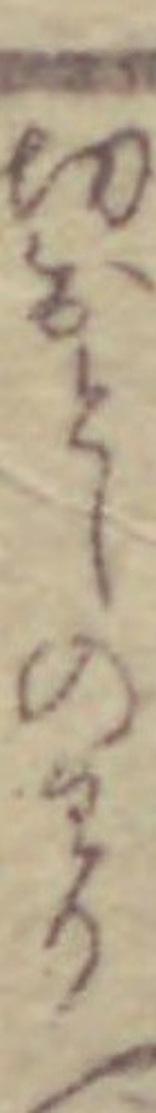切おとしのわり
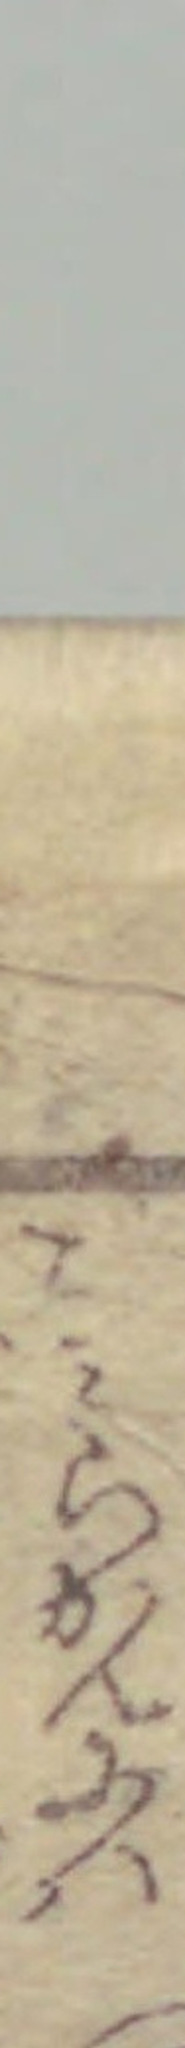こみらかんには
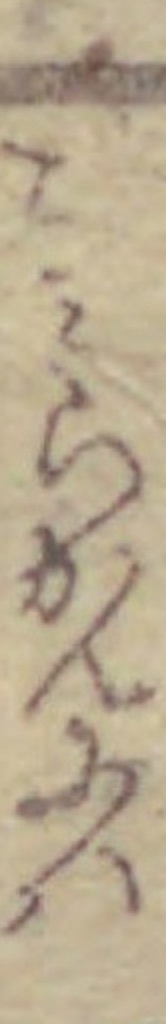こみらかんには
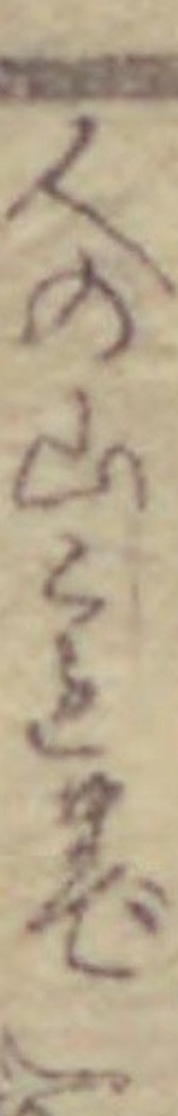人の山これまで
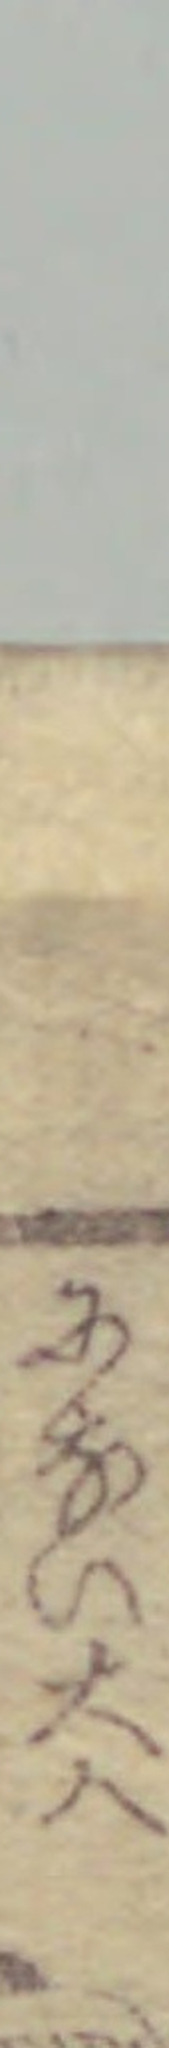にない大入
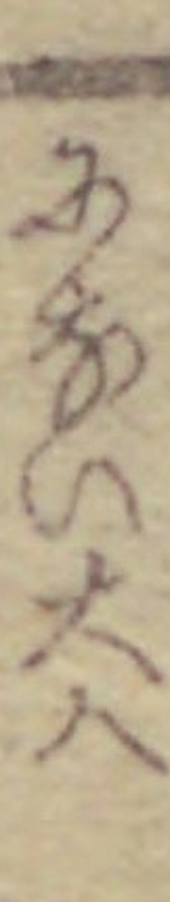にない大入
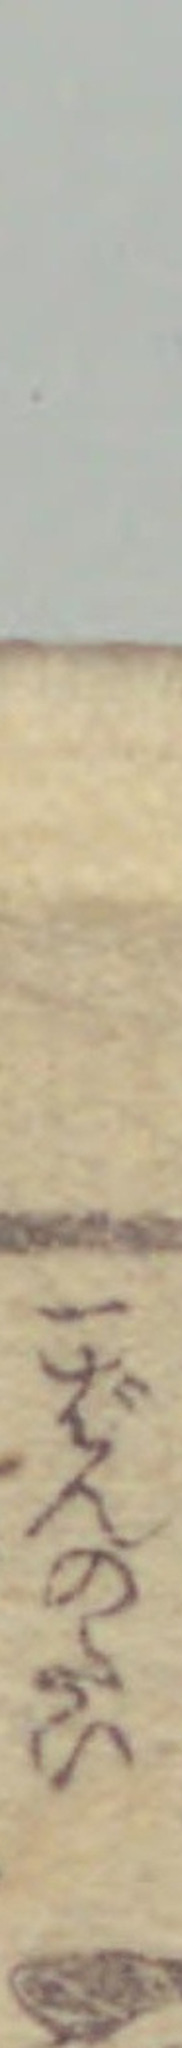一ばんのたい
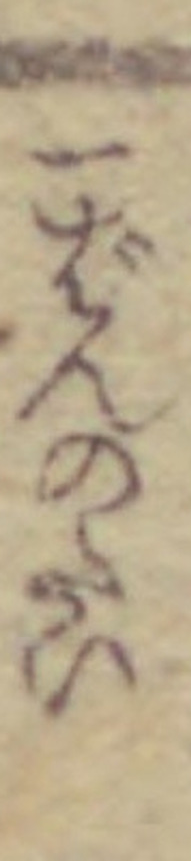一ばんのたい
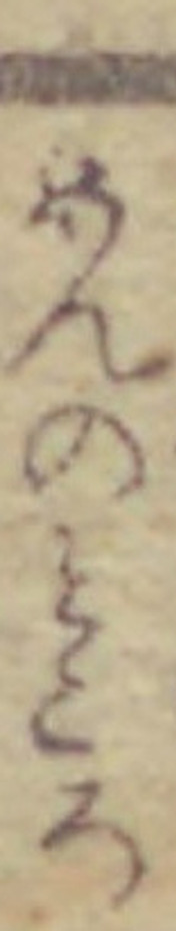めんのところ
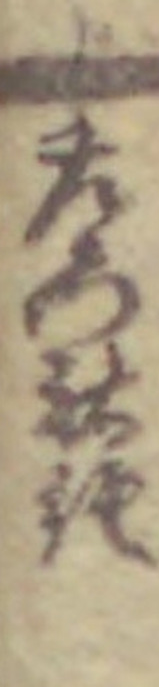左エ門祐経
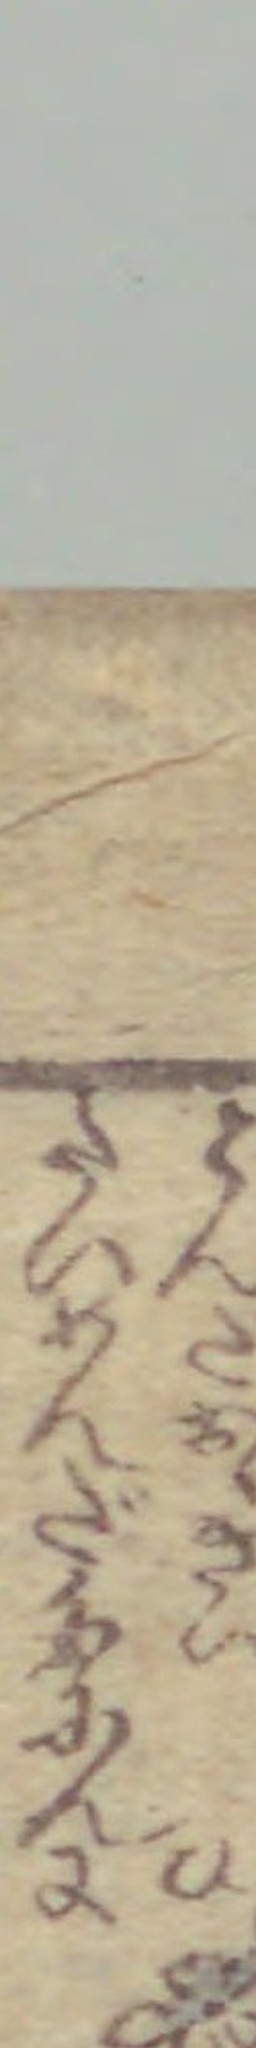たいめんだたにんに
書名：思事夢濃枕 3巻
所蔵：国立国会図書館 National Diet Library, JAPAN
